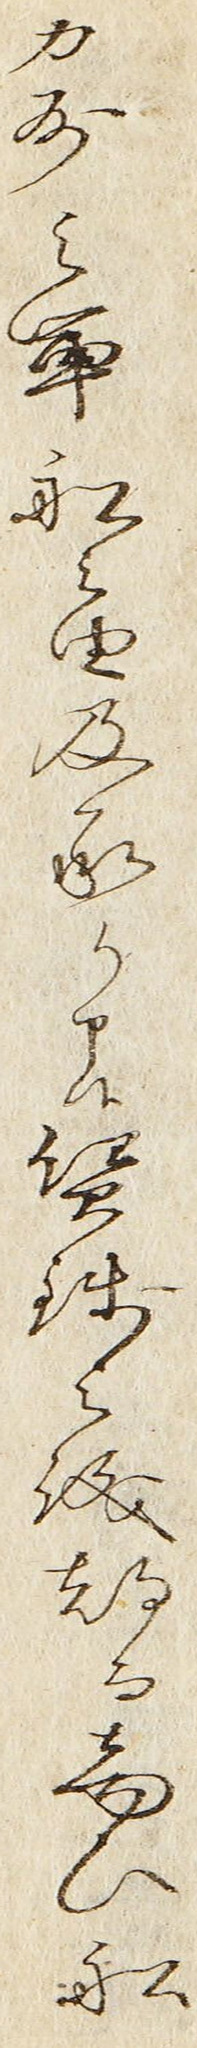カ州之軍船之由及承り申候賃銭之儀都而商ひ船
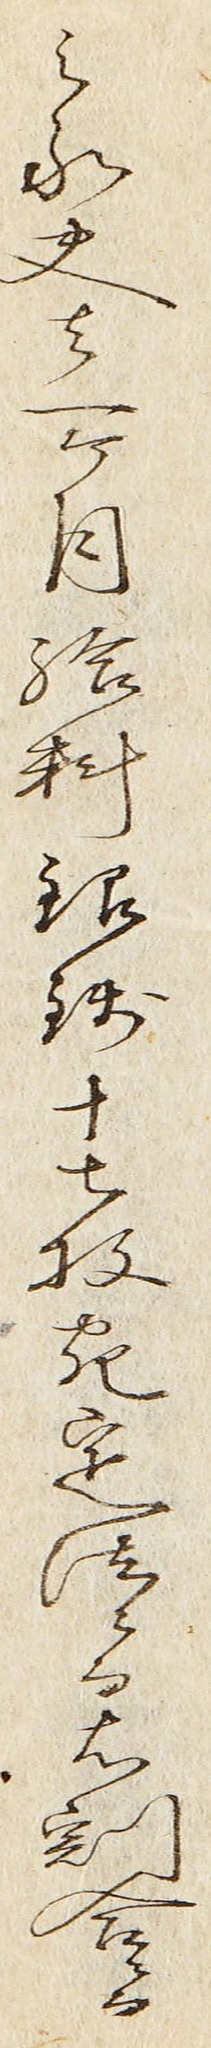之水夫は一ヶ月給料銀銭十七枚宛定法に而右割合に而
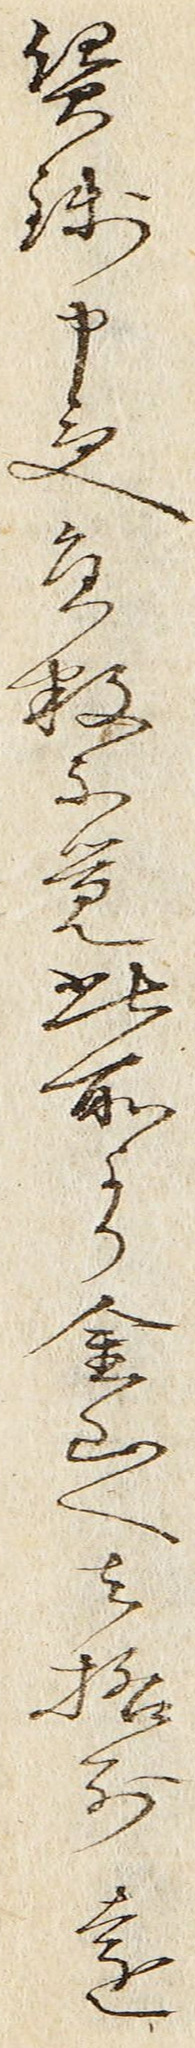賃銭申受院員数不覚此所より金山へは格別遠
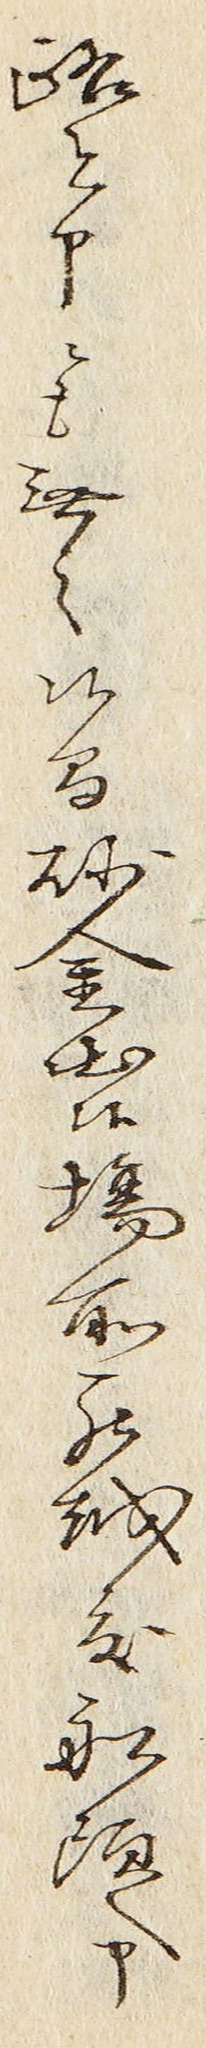路と申にも無之候間砂金出候場所罷越度船頭へ申
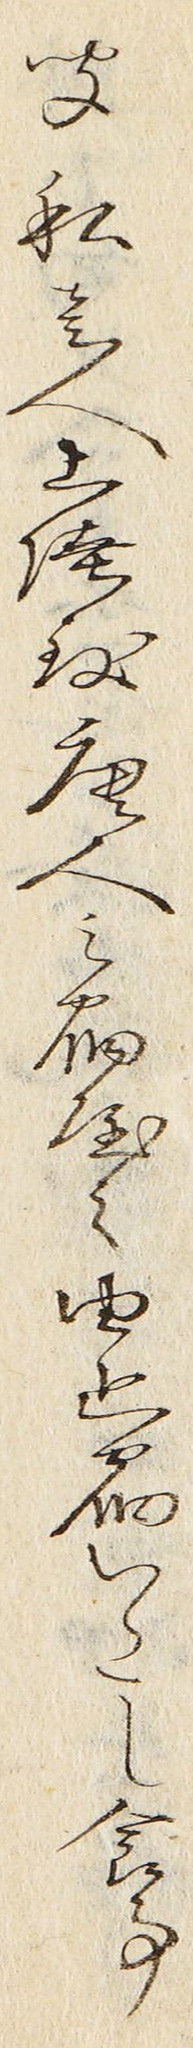聞私壱人上陸致唐人之宿屋之由止宿いたし食事
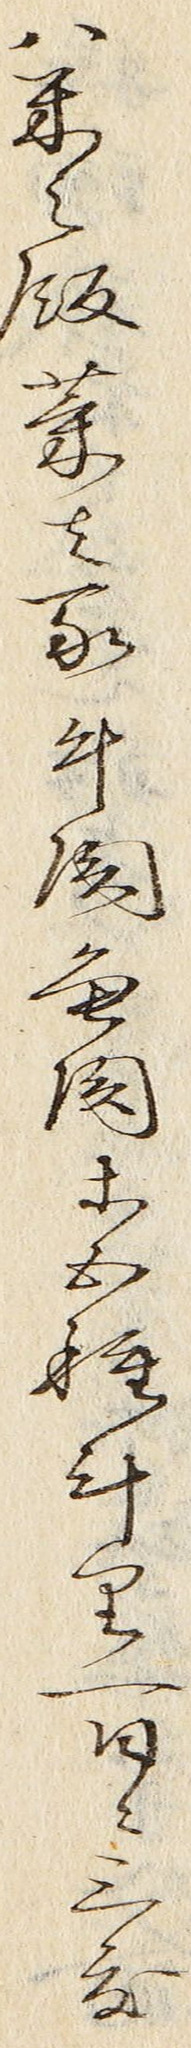は米之飯菜は豕牛肉魚肉等ご五種計り一日に三度
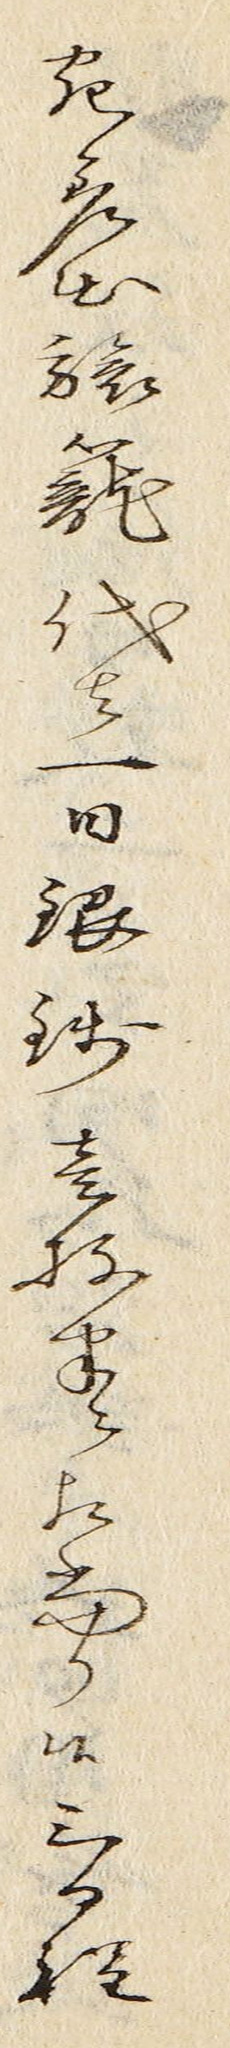宛差出旅籠代は一日銀銭壱枚半に相当り候三日程
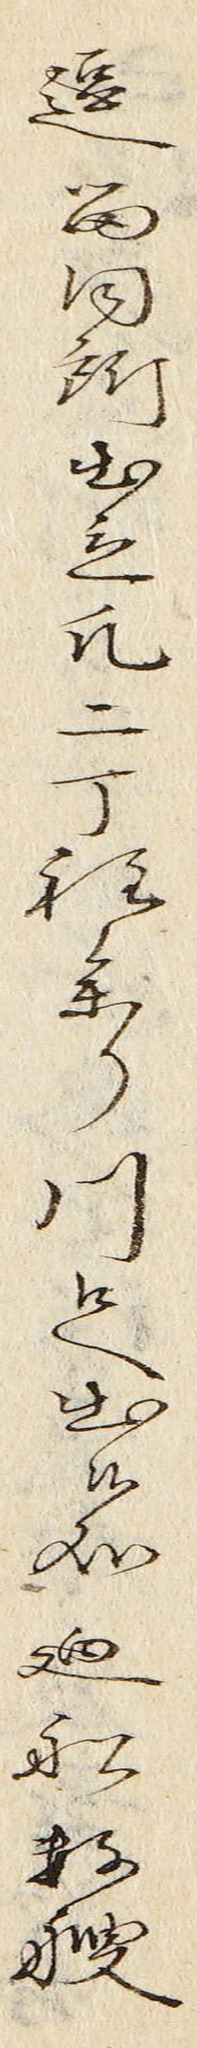逗留同所出立凡二丁程参り川口へ出候処廻船数艘
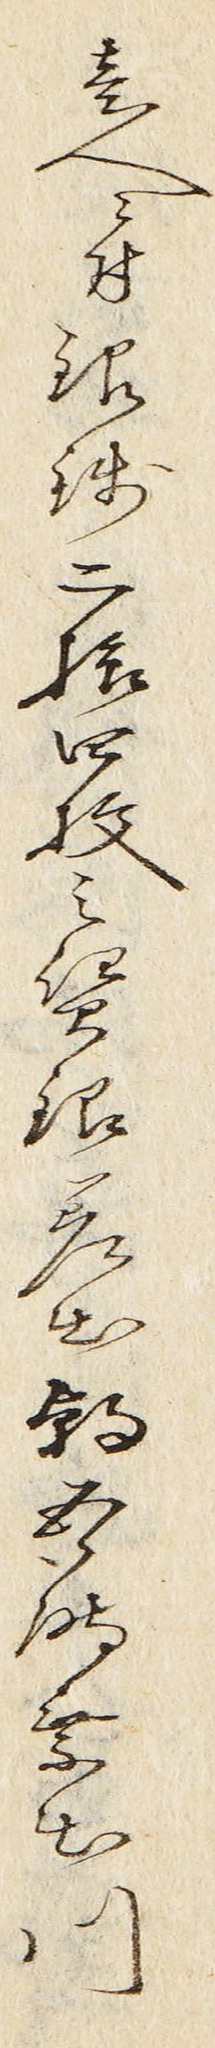壱人に付銀銭二拾四枚之賃銀差出朝五ッ時乗出川
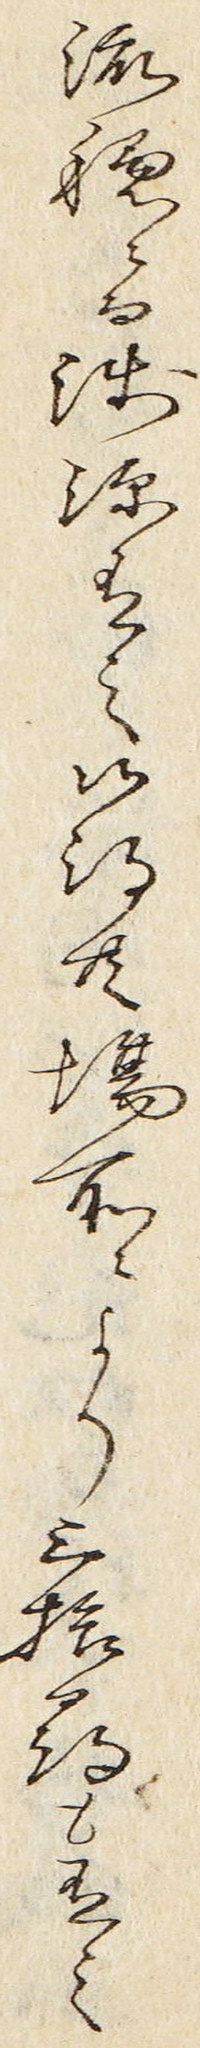流穏に而浅深有之候得共場所により三拾尋も有之
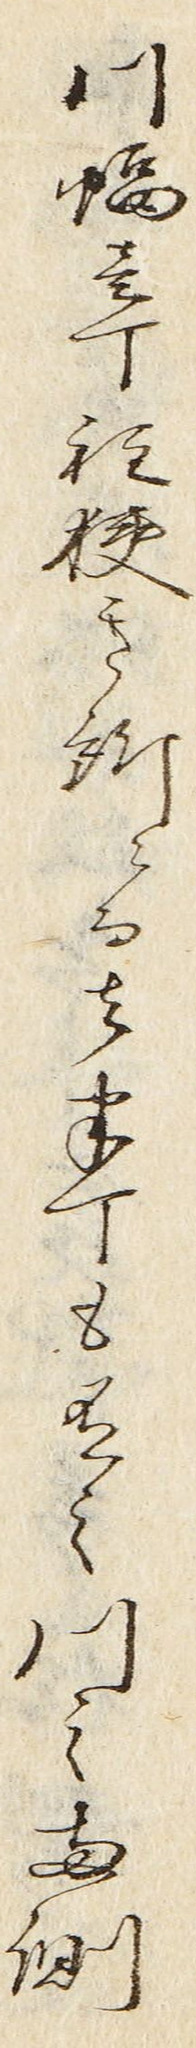川幅壱丁程狭き所に而は半丁も有之川之両側
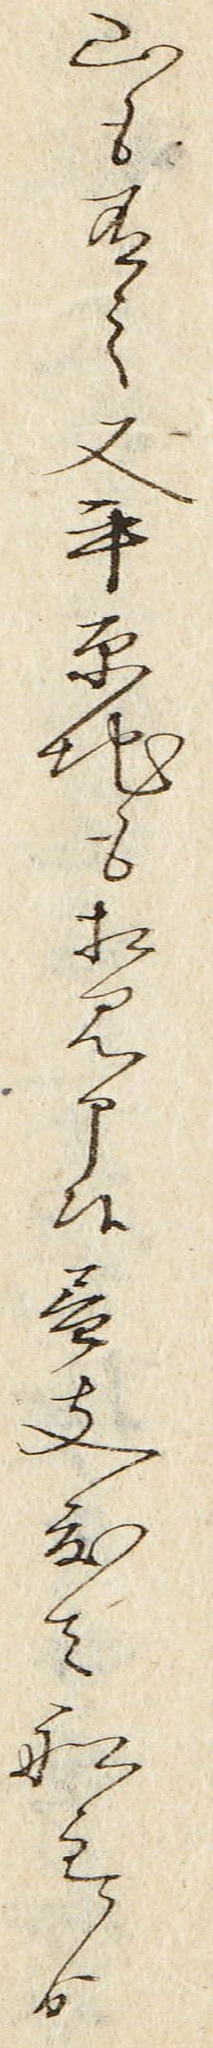山も有之又平原地も相見申候昼仕度は船主ゟ
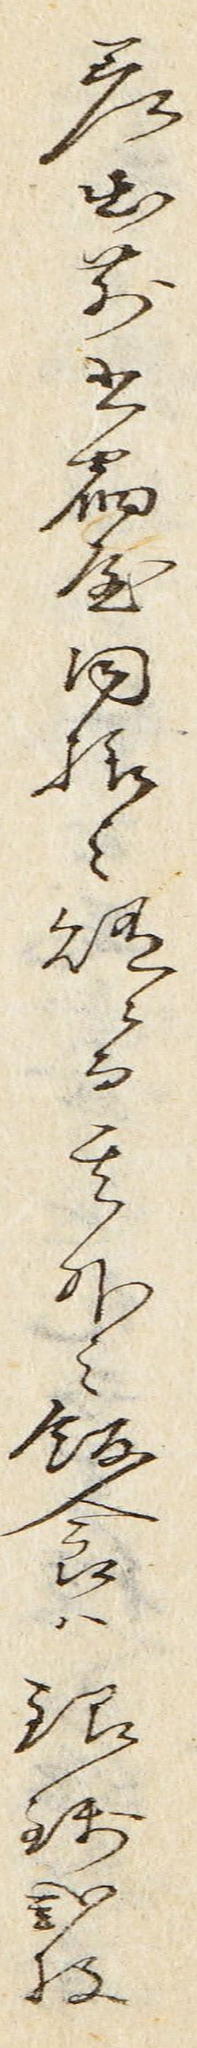差出前書宿屋同様之賄に而其外に飯食は銀銭弐枚
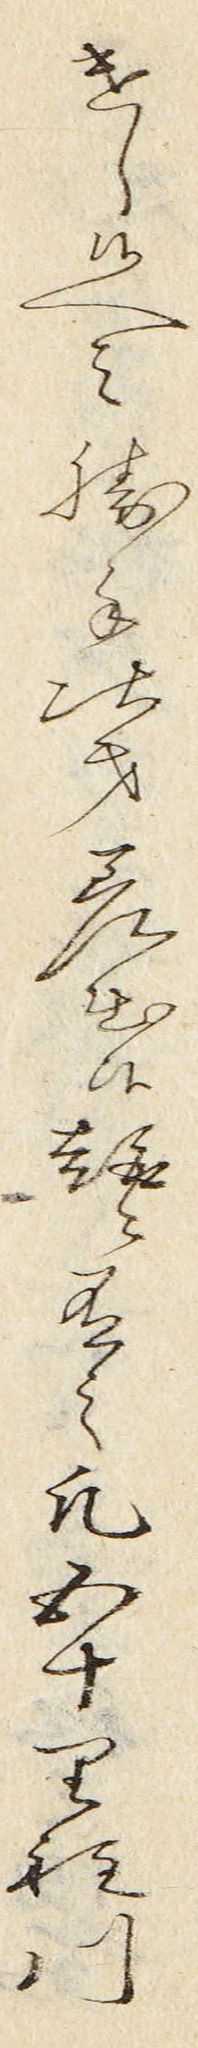遣し候へ勝手次第差出候趣に有之凡五十里程川
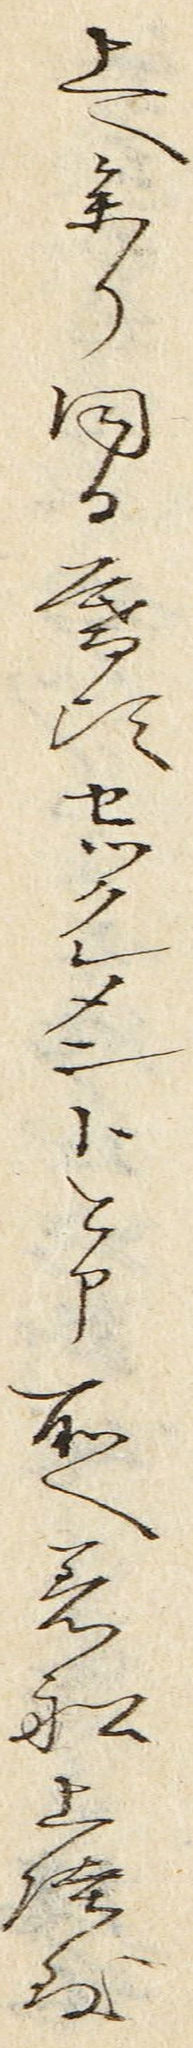上へ参り同日暮頃セツクレメントと申所へ着船上陸致

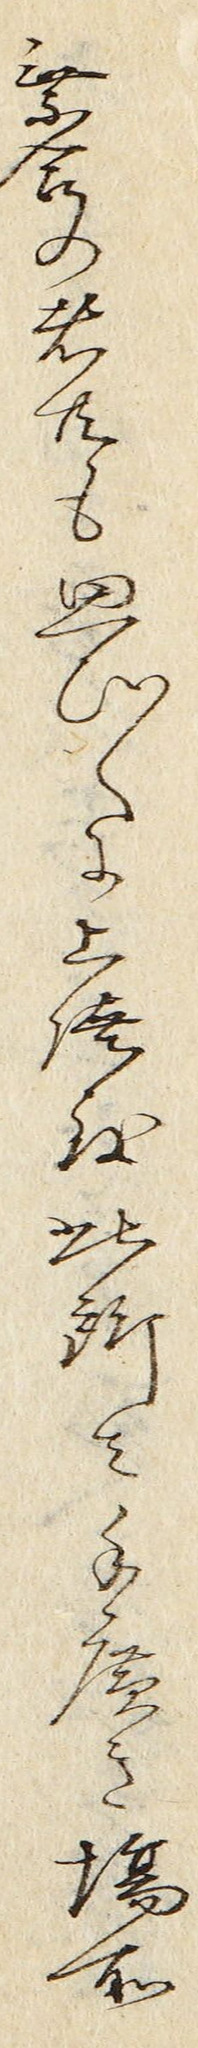乗合の者共も思ひ〳〵に上陸致此所は手広き場所
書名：土佐中浜万次郎漂流記
